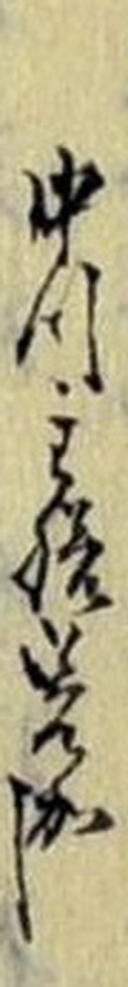中川主膳差加
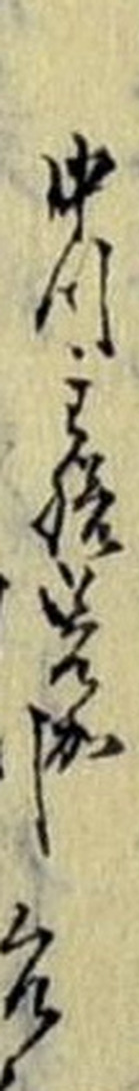中川主膳差加
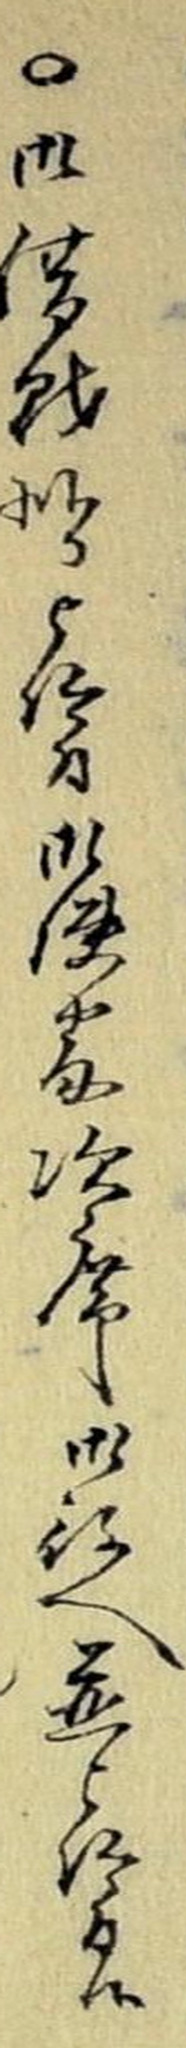○御借財掛り被仰付御使番次席御役人並被仰付候
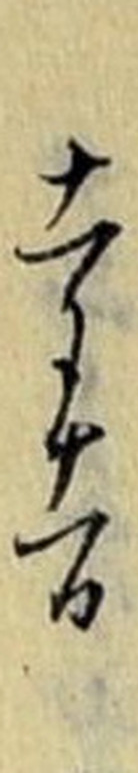十一月四日
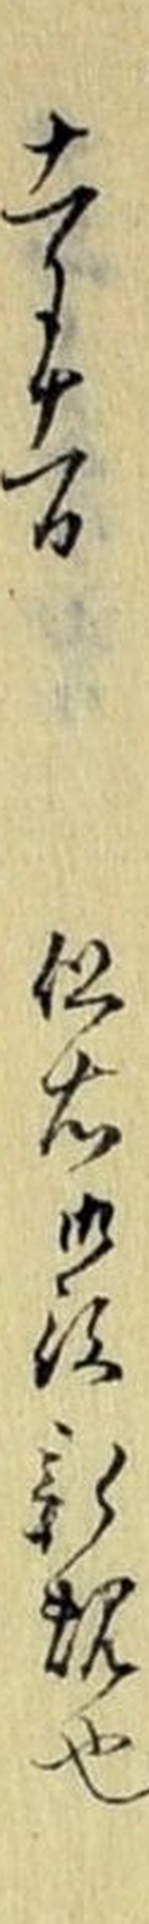十一月十一日但右御役新規也
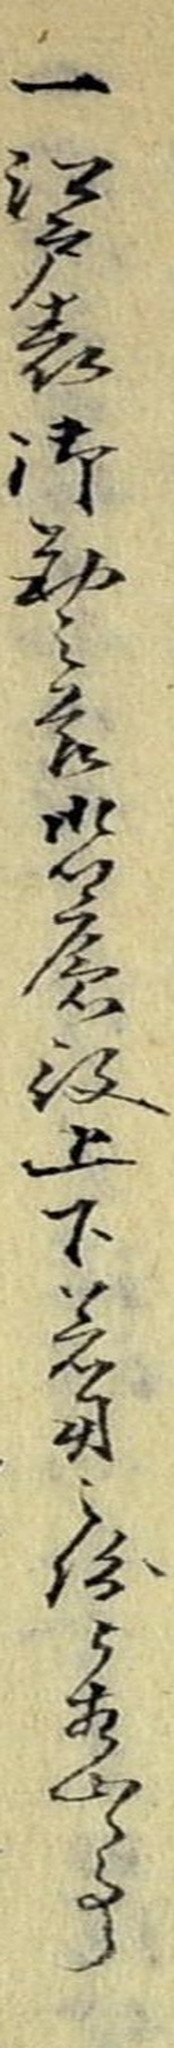一江戸表御勤之節御簾役上下着用之儀被相止候事
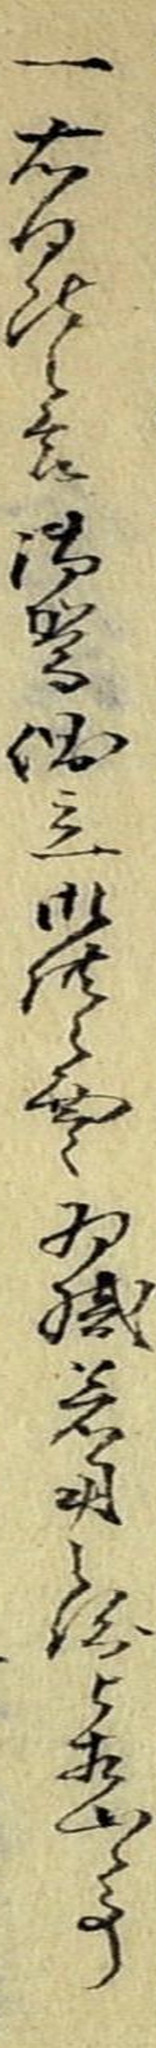一右同断之節御駕側立御供之面々羽織着用之儀被相止候事
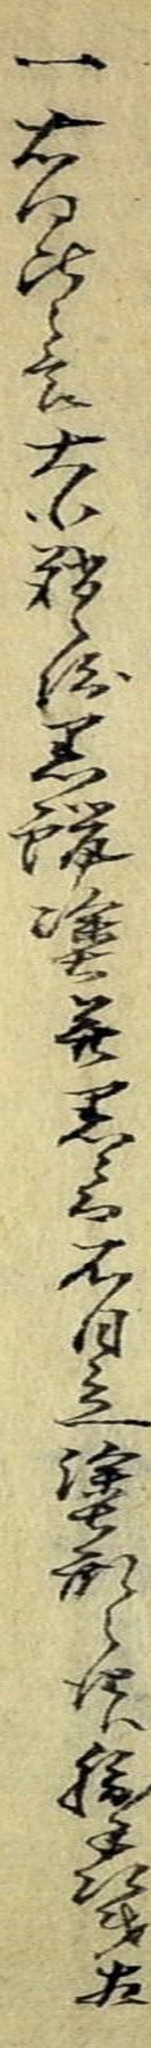一右同断之節大小鞘之儀黒鍔塗并黒に而不目立塗形之儀は勝手次第相
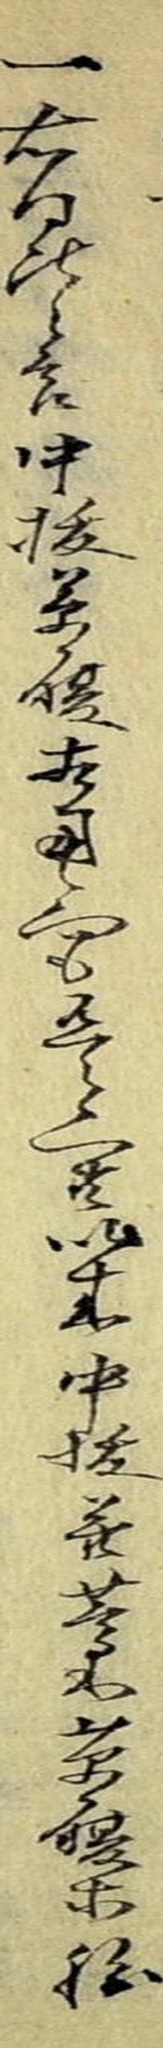一右同断之節中抜草履相用候向も有之候へ共以来中抜并藁草履等勝
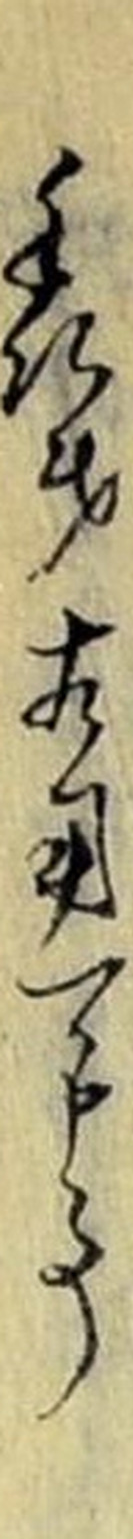手次第相用可申事
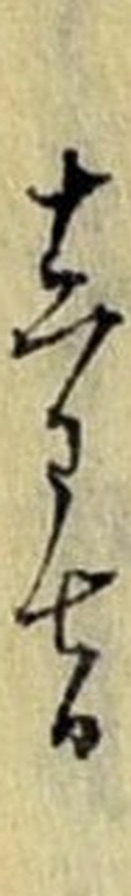十二月七日
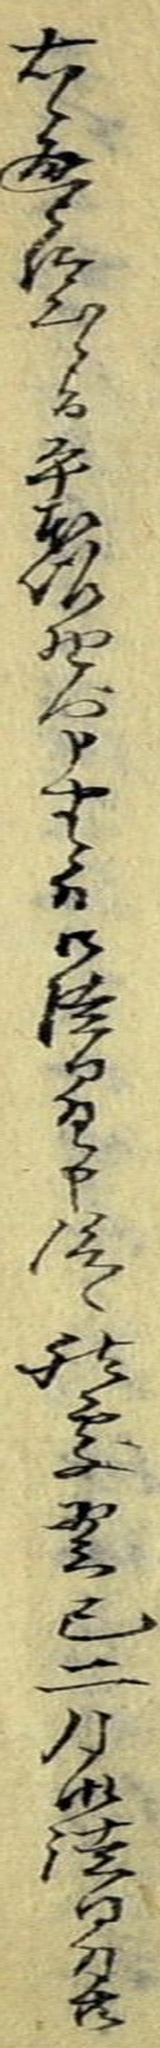右之通被仰出候間平本作野右衛門申聞候に付御徒目付へ申渡候然処翌巳二月御徒目付共

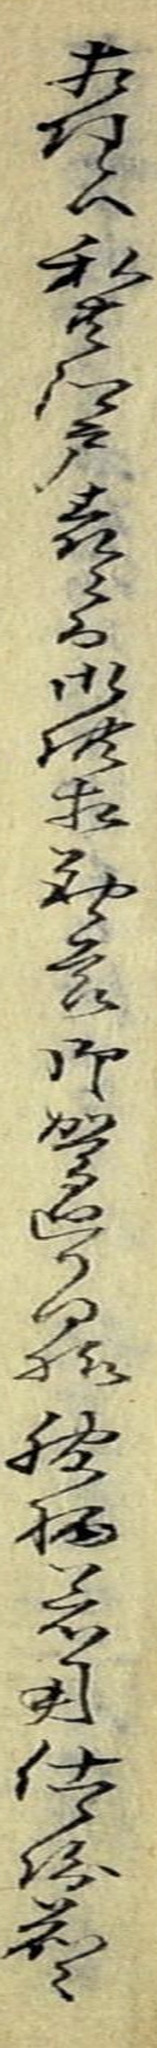相伺候は私共江戸表に而御供相勤候節御駕廻り同様服柄着用仕候儀前々
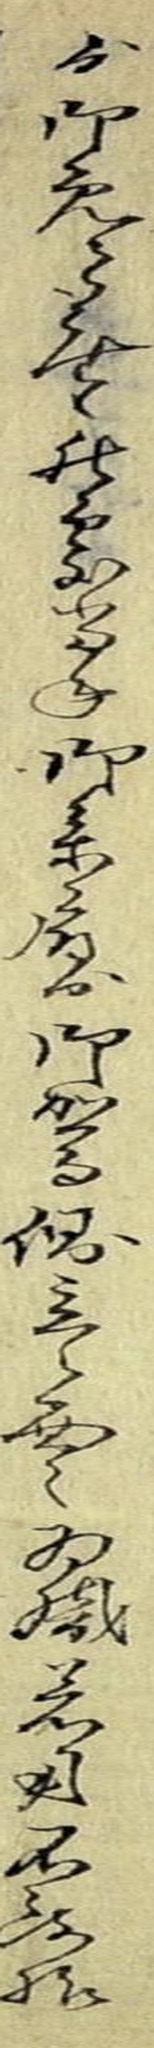ゟ御免に御座候然処当年御参府ゟ御駕側立之面々羽織着用不致様
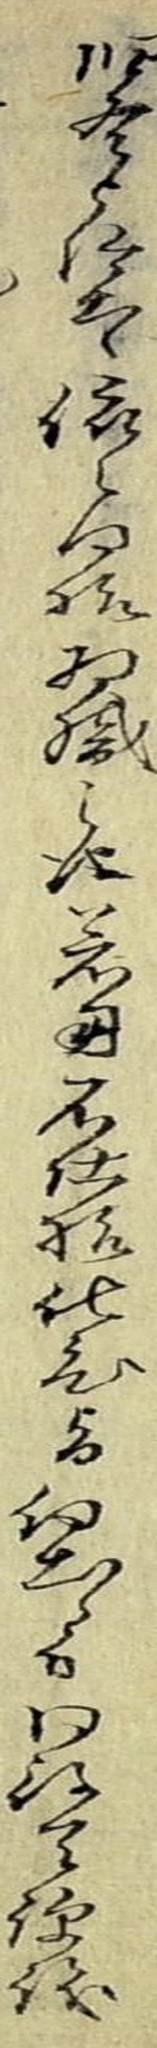旧冬被仰出候依之同様羽織之儀着用不仕様仕度旨伺出候に付同役令評議
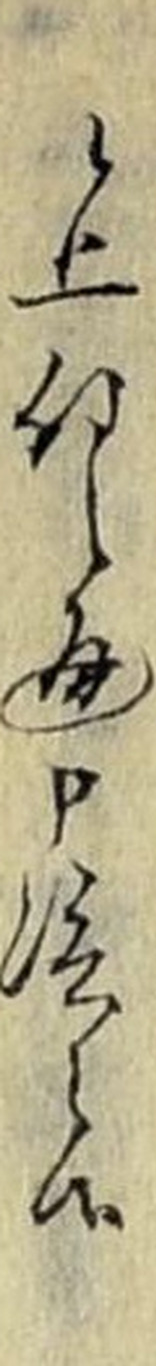候上伺之通申渡之候
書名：命令之部 六
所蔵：福井県文書館 Fukui Prefectural Archives
